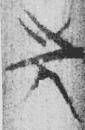先
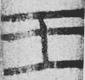王
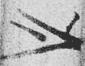之
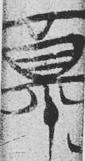福
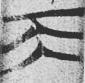天
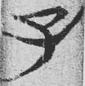子
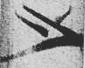之
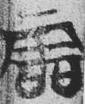霝（靈）
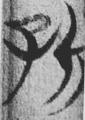孤
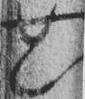也
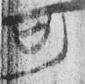可（何）
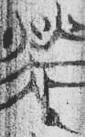○（勞）
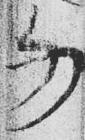力
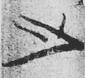之
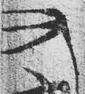又（有）
